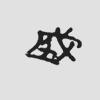城
